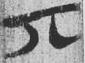亓（其）
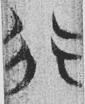行
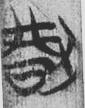○（荊）
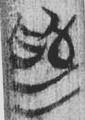爲
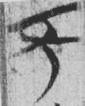不
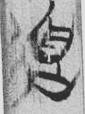道
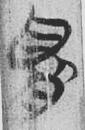{胃刀}（謂）
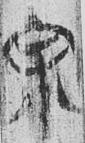余
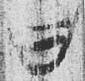曰
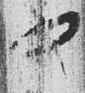女（汝）
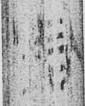周
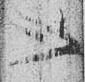之
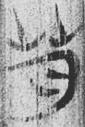○（孽）
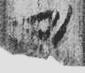子
